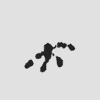方
